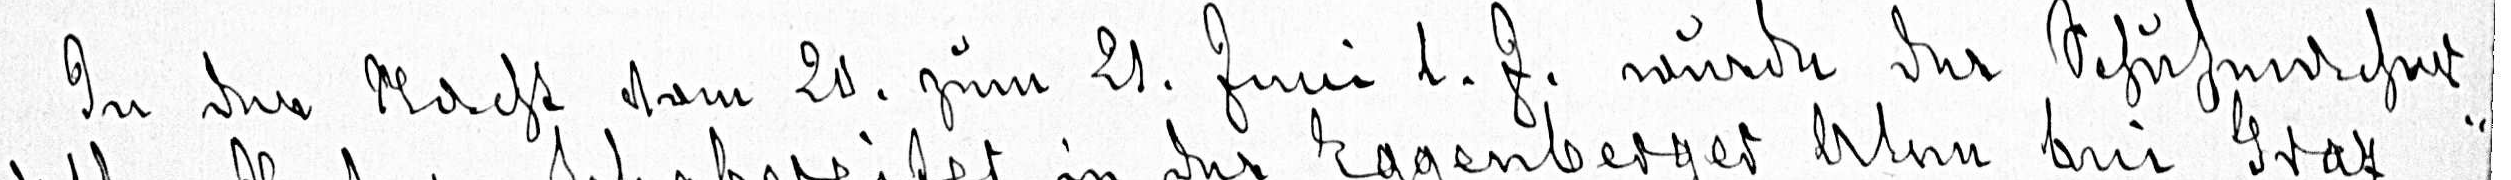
In der Nacht vom 20. zum 21. Juni l. J. wurde der Schumacher¬
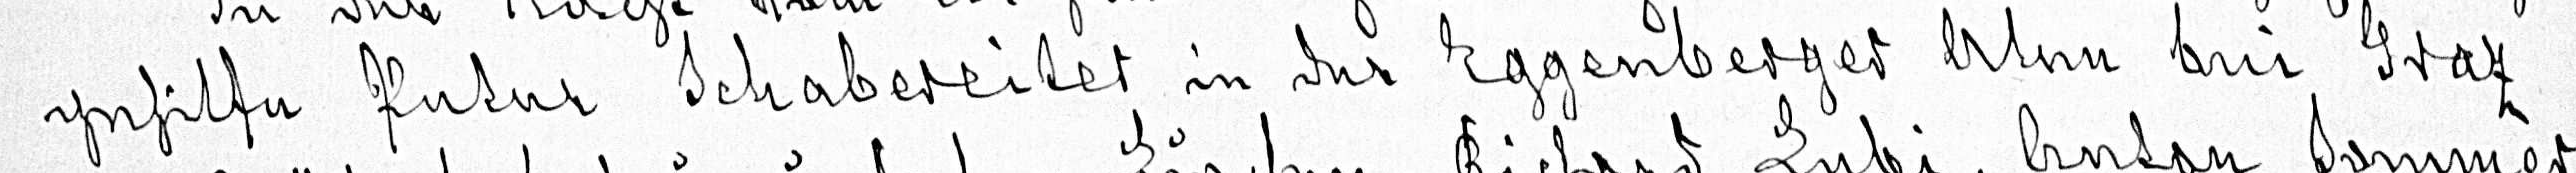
gehilfe Peter Schabereiter in der Eggenberger Alee bei Graz
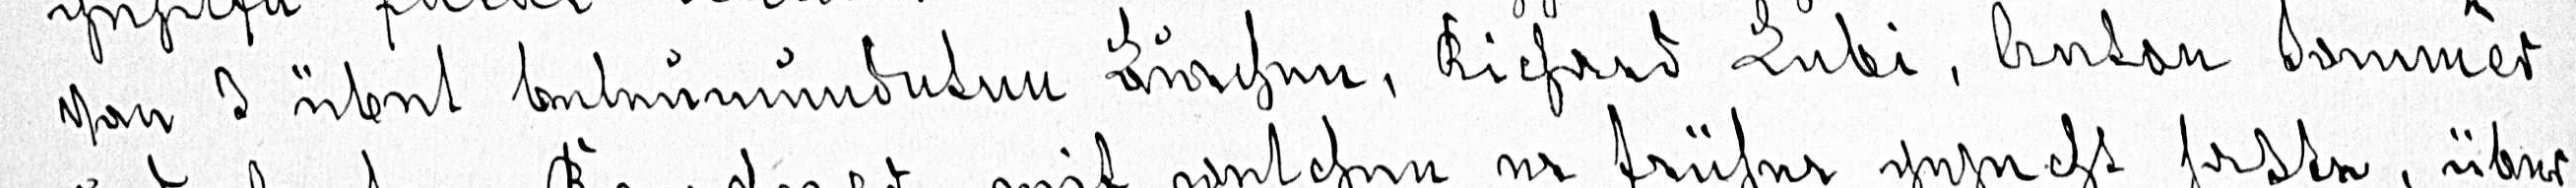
von 3 übel beleumundeten Burchen, Richard Lubi, Anton Sommer
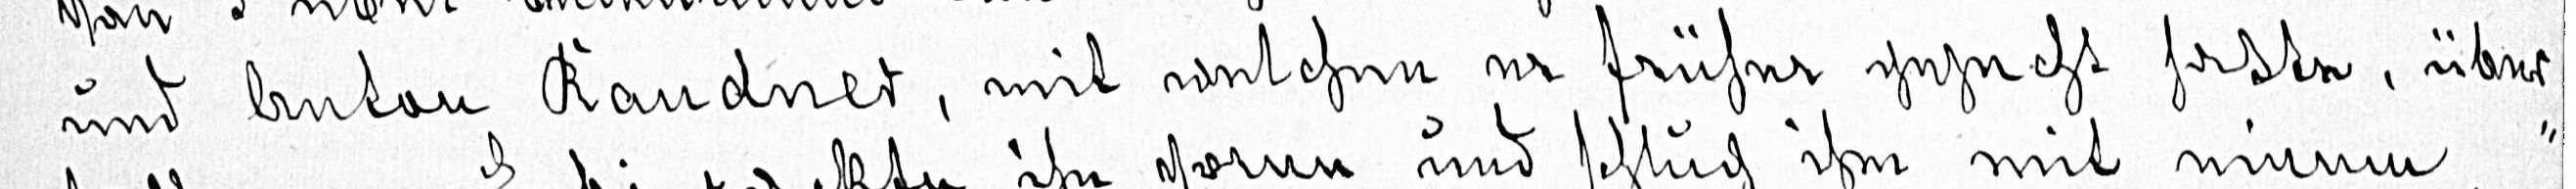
und Anton Raudner, mit welchen er früher gezecht hatte, über¬
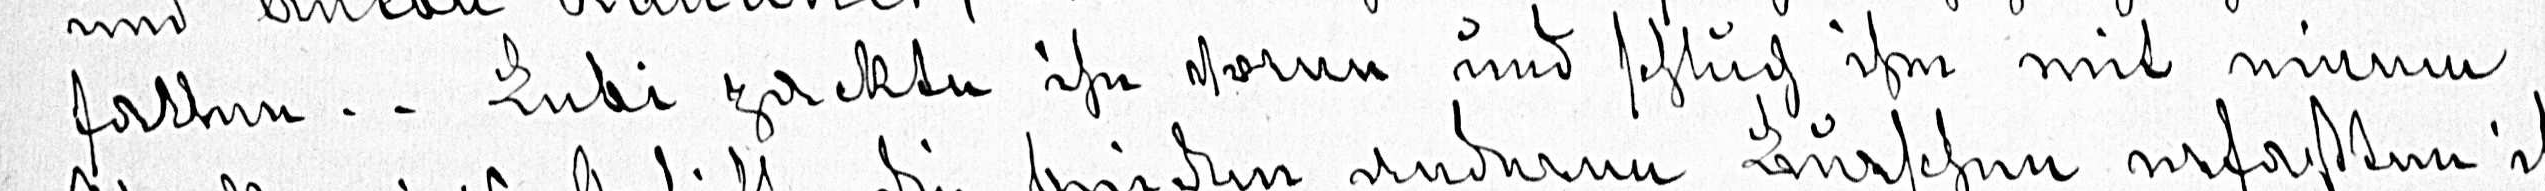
fallen. Lubi packte ihn vorne und schlug ihm mit einem
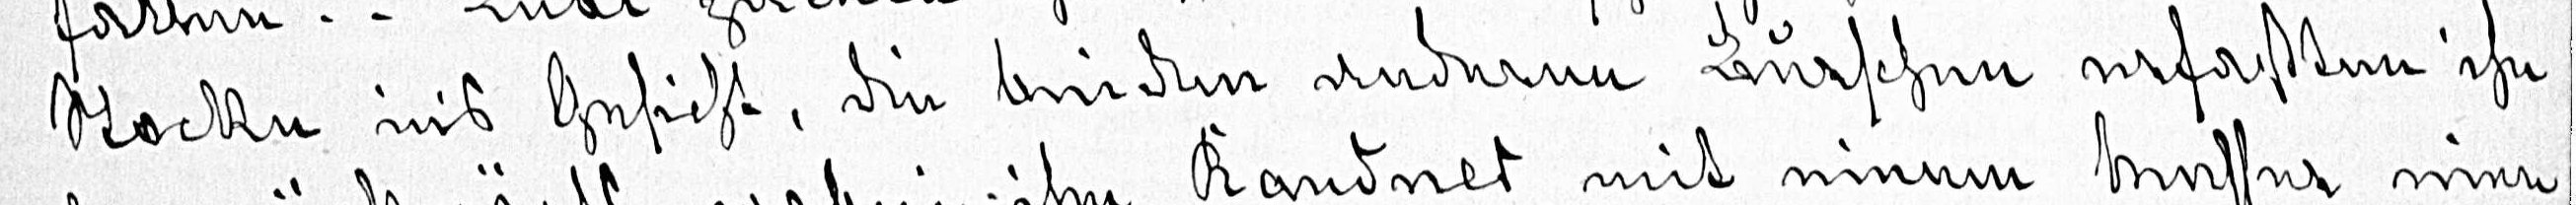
Stocke ins Gesicht, die beiden anderen Burschen erfaßten ihn
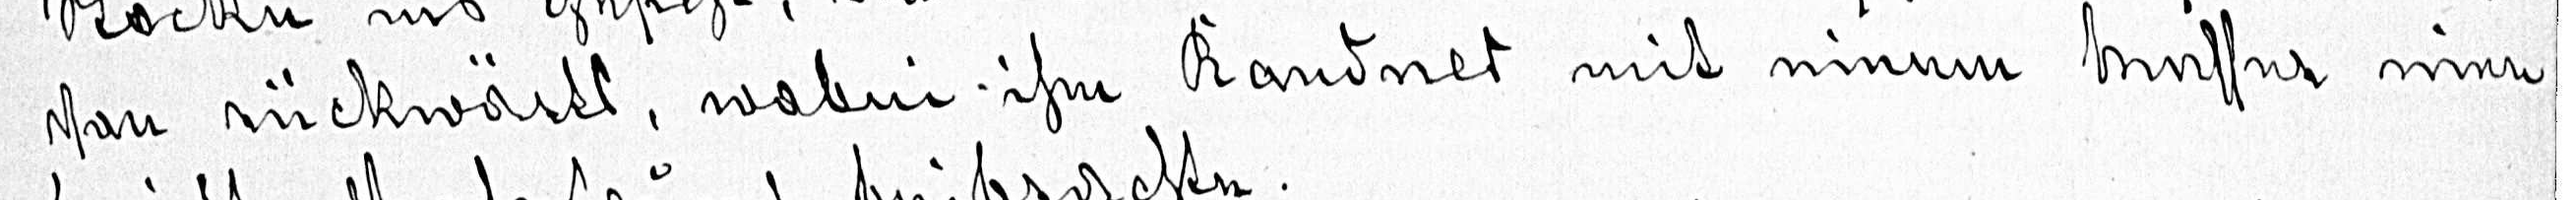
von rückwärts, wobei ihm Randner mit einem Messer eine
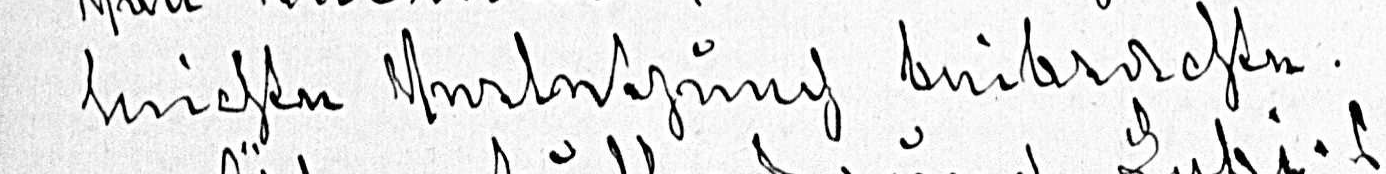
leichte Verletzung beibrachte.
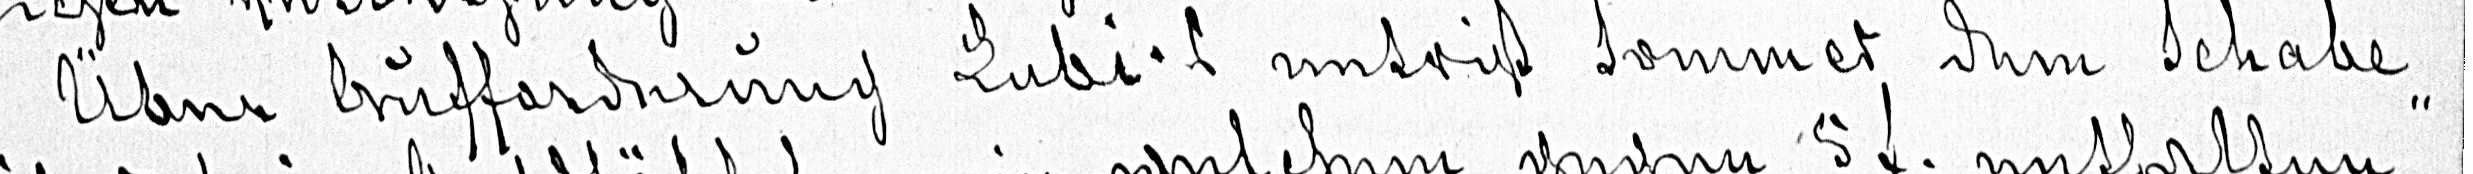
Über Aufforderung Lubi’s entriß Sommer dem Schabe¬
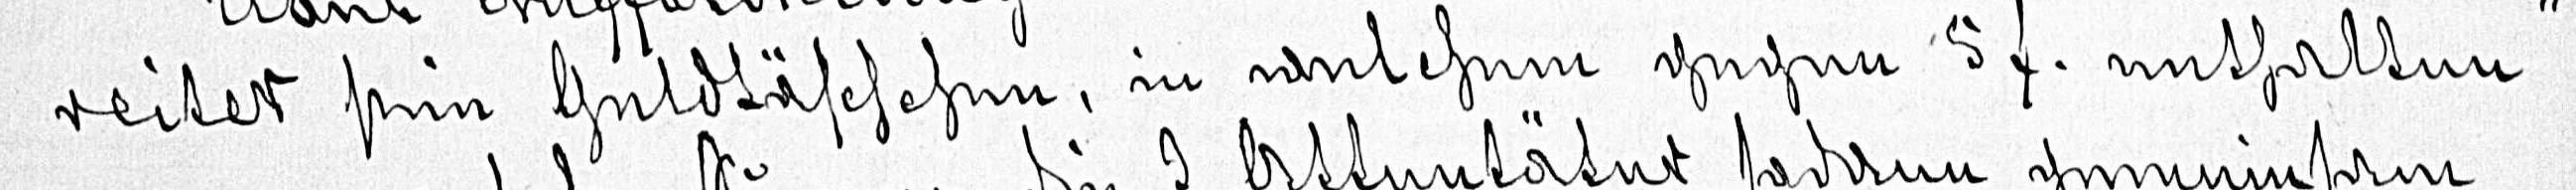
reiter sein Geldtäschen, in welchem gegen 5f enthalten
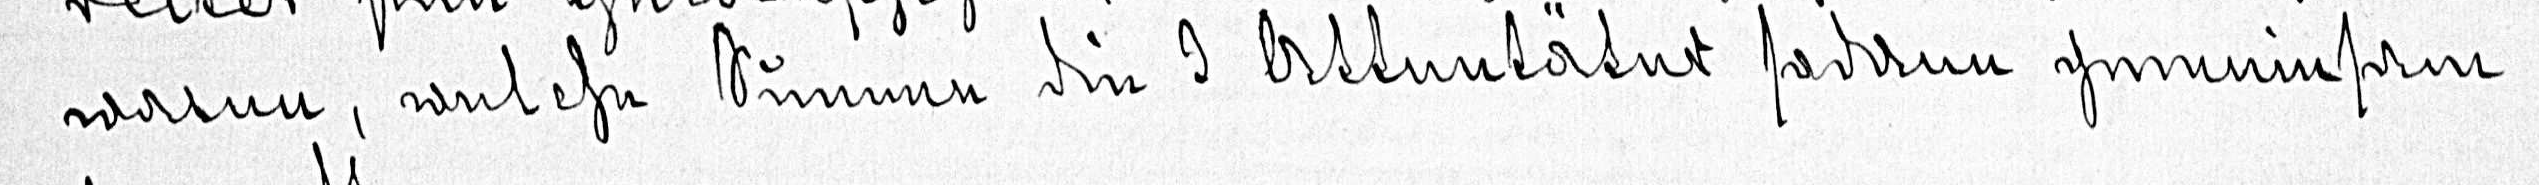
waren, welche Summe die 3 Attentäter sodann gemeinsam
